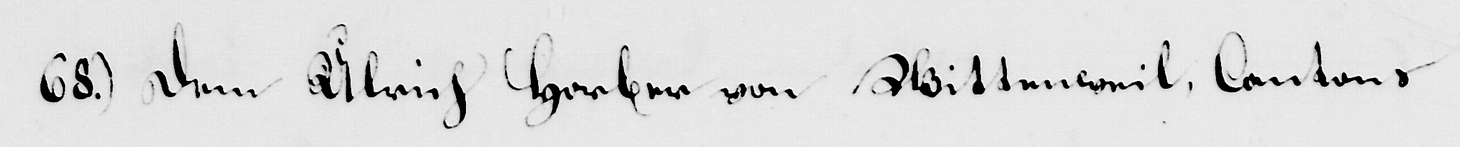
68.) dem Ulrich Horber von Wittenweil, Cantons
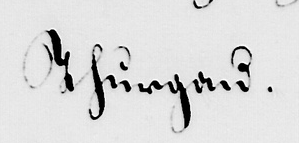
Thurgau.
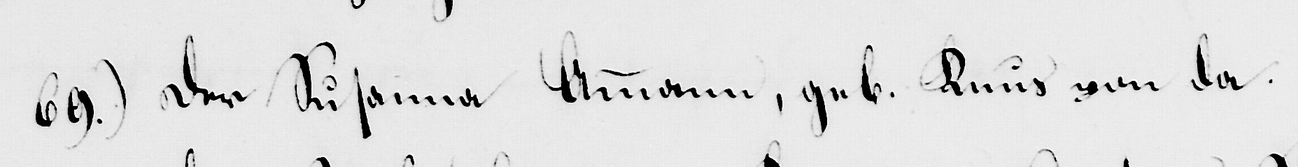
69.) der Susanna Ammann, geb. Knus von da.
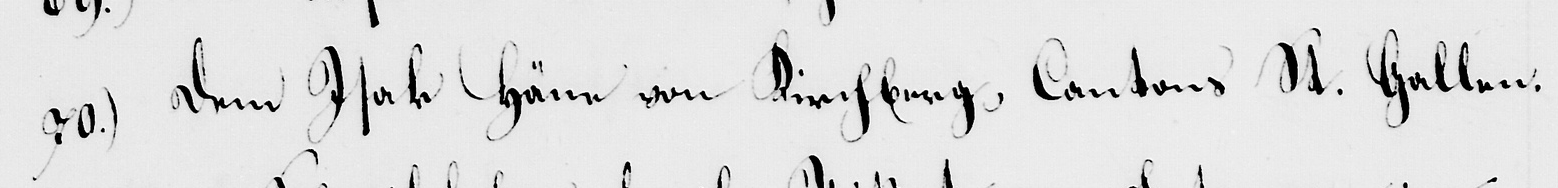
70.) dem Isak Häne von Kirchberg, Cantons St. Gallen.
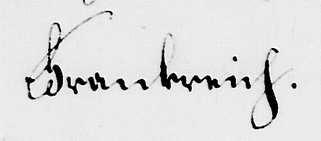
Frankreich.
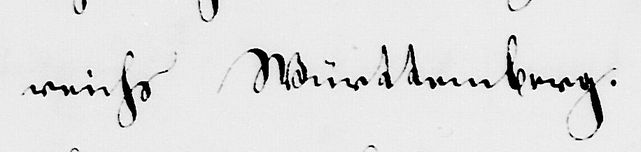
reichs Württemberg.
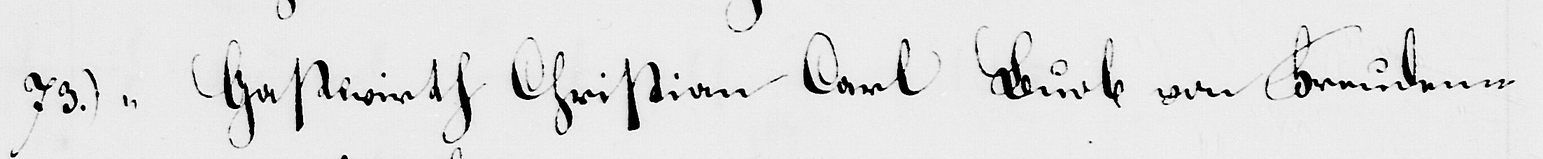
73.) " Gastwirth Christian Carl Buob von Freuden¬
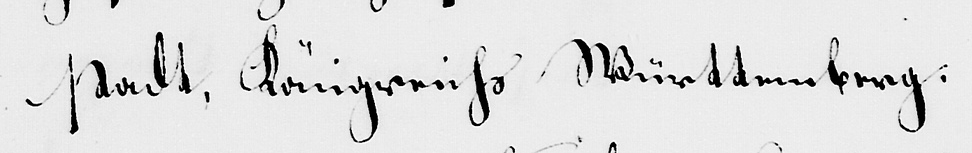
stadt, Königreichs Württemberg.
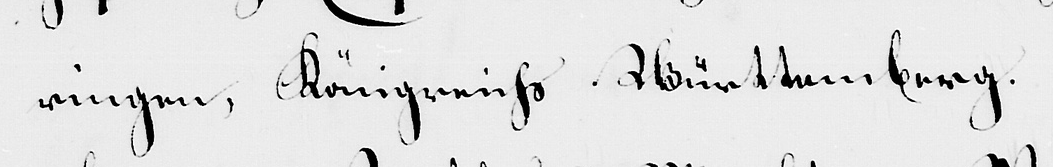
ringen, Königreichs Württemberg.
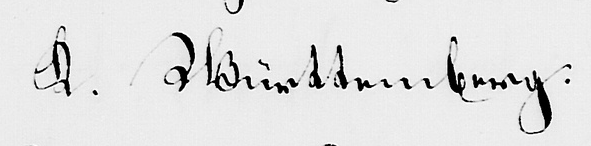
K. Württemberg.
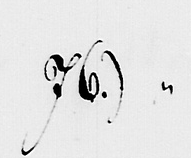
76.)
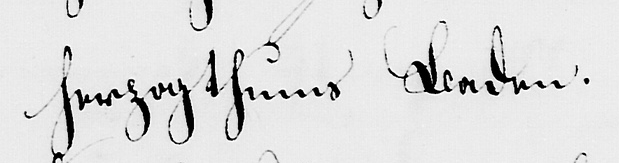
herzogthums Baden.
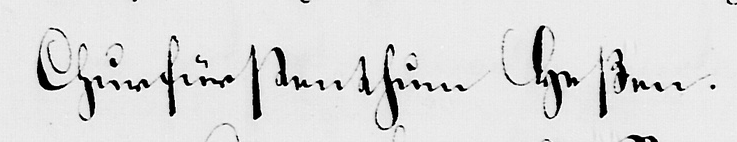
Churfürstenthum Heßen.
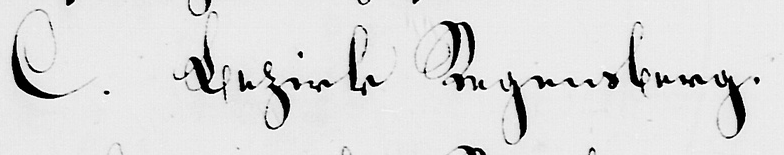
C. Bezirk Regensberg.
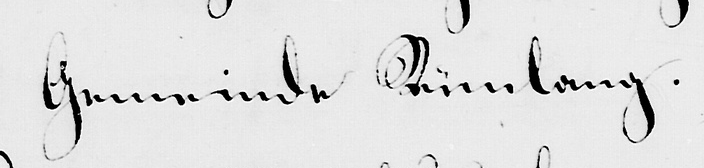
Gemeinde Rümlang.
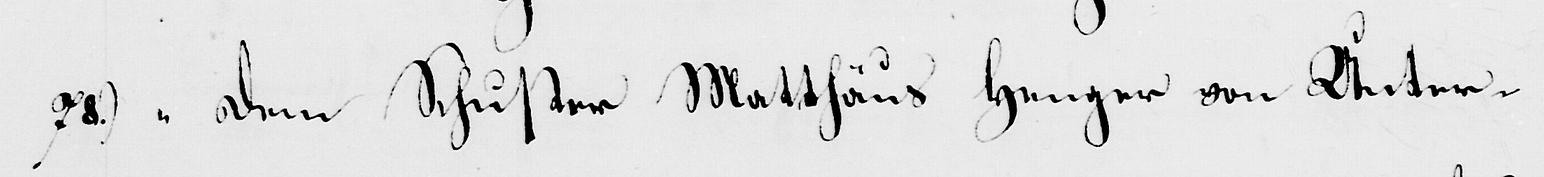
78.) " dem Schuster Matthäus Henger von Unter-
